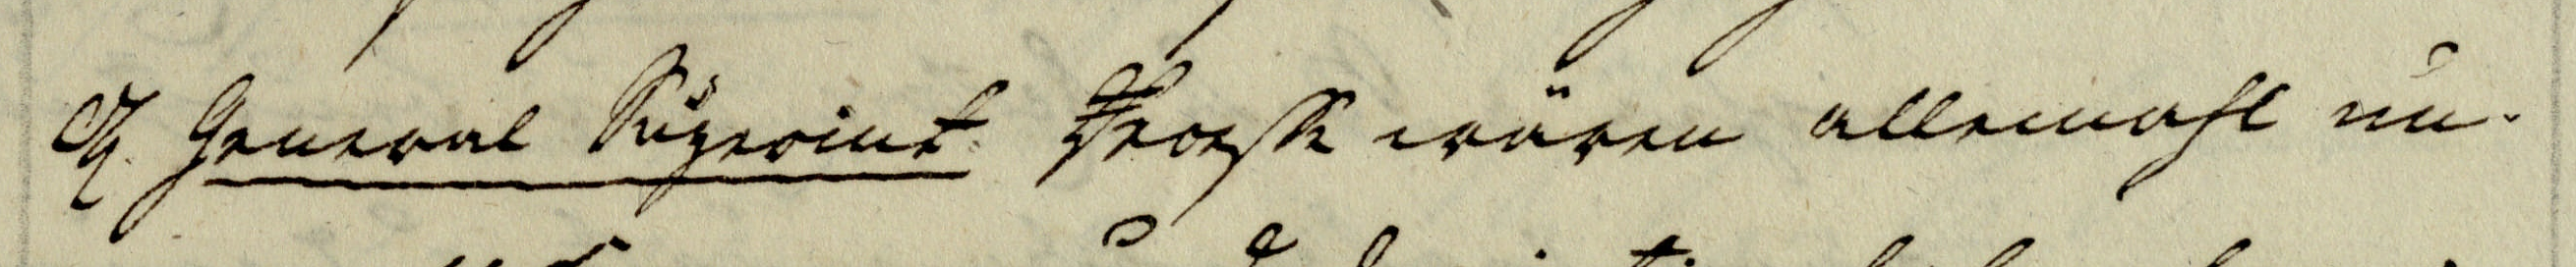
dh. General Superint. Recess wären allemahl un¬
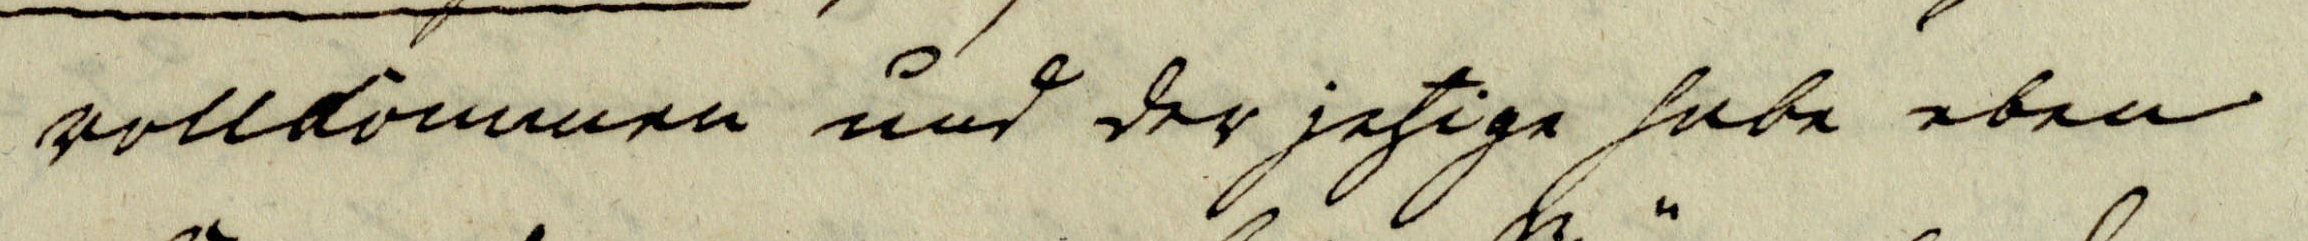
vollkommen und der jetzige habe eben
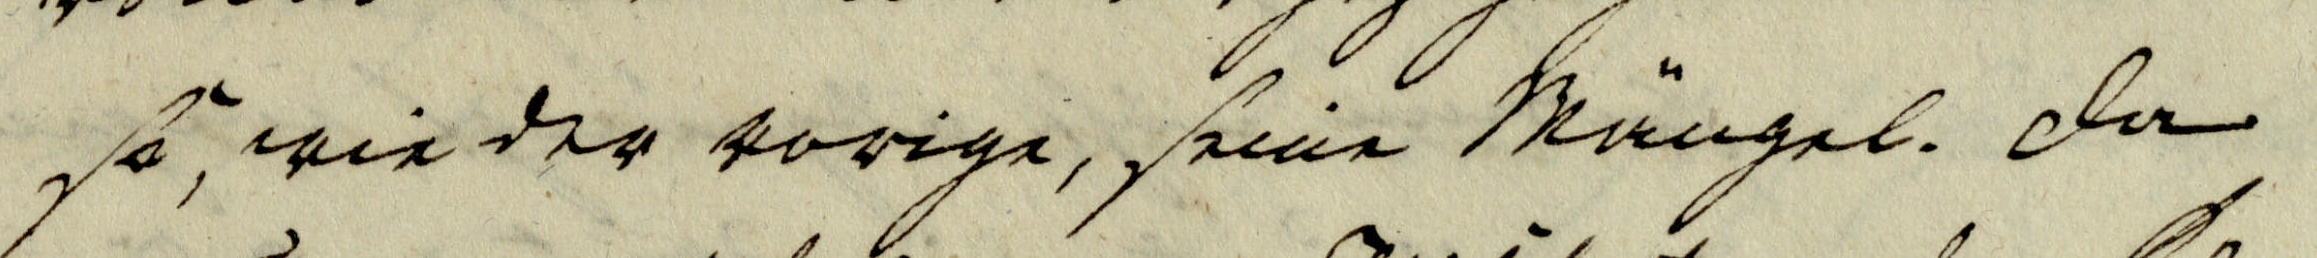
so, wie der vorige, seine Mängel. Da
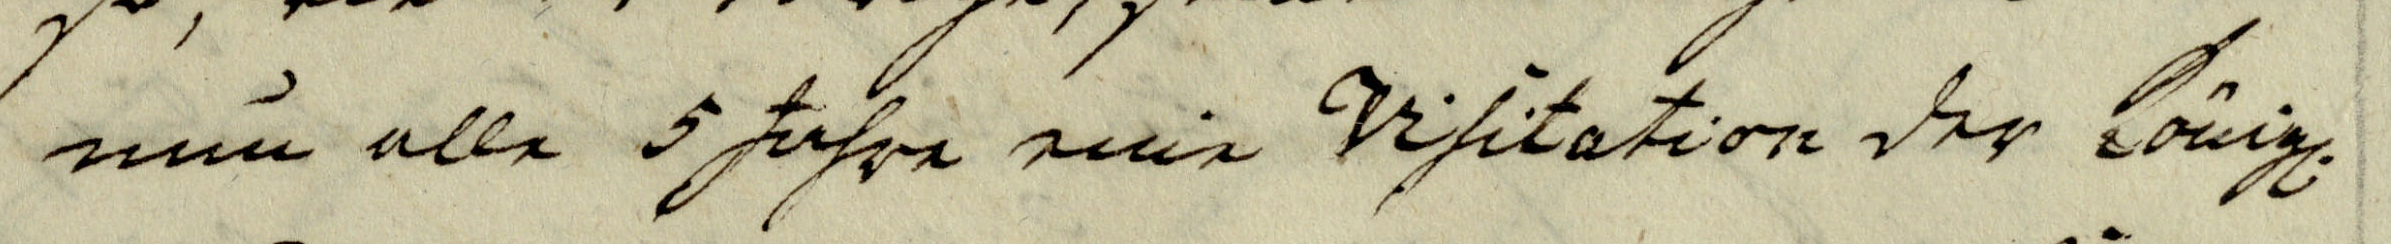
nun alle 5 Jahre eine Visitation der Königl.
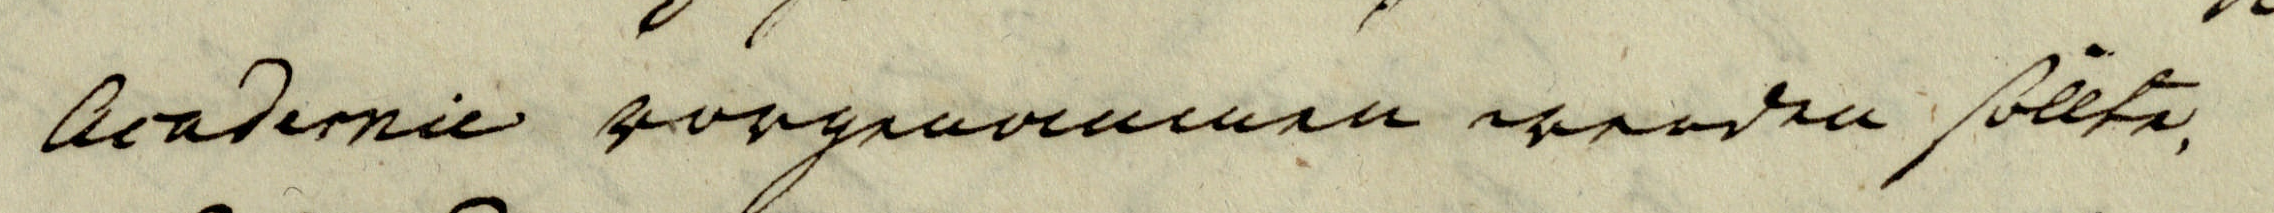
Academie vorgenommen werden sollte,
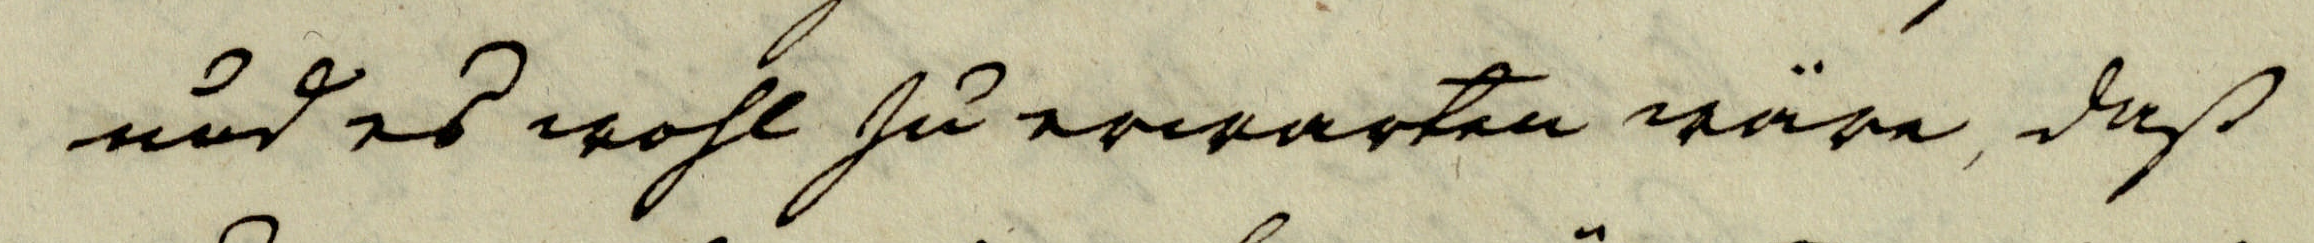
und es wohl zu erwarten wäre, daß
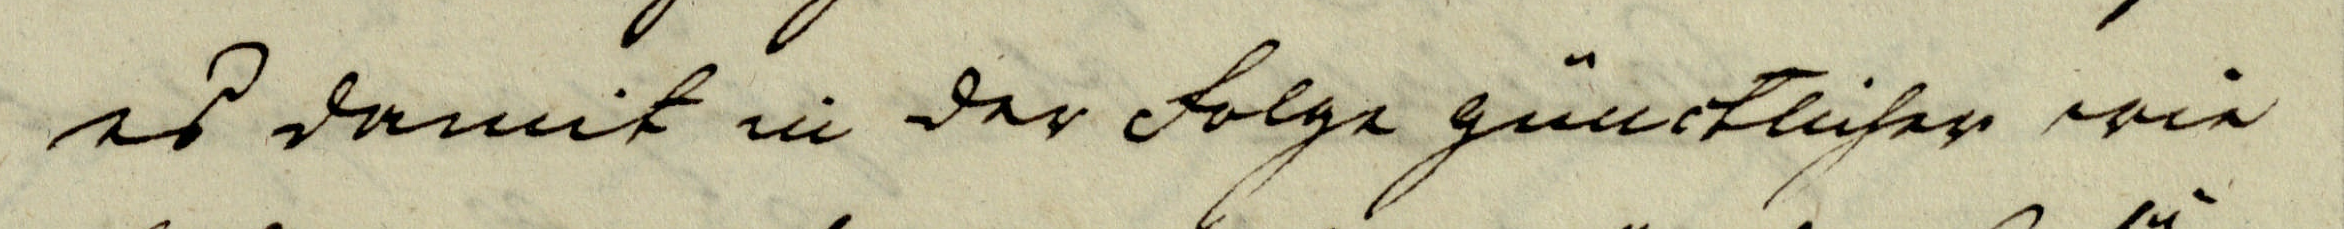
es damit in der Folge günstlicher wie
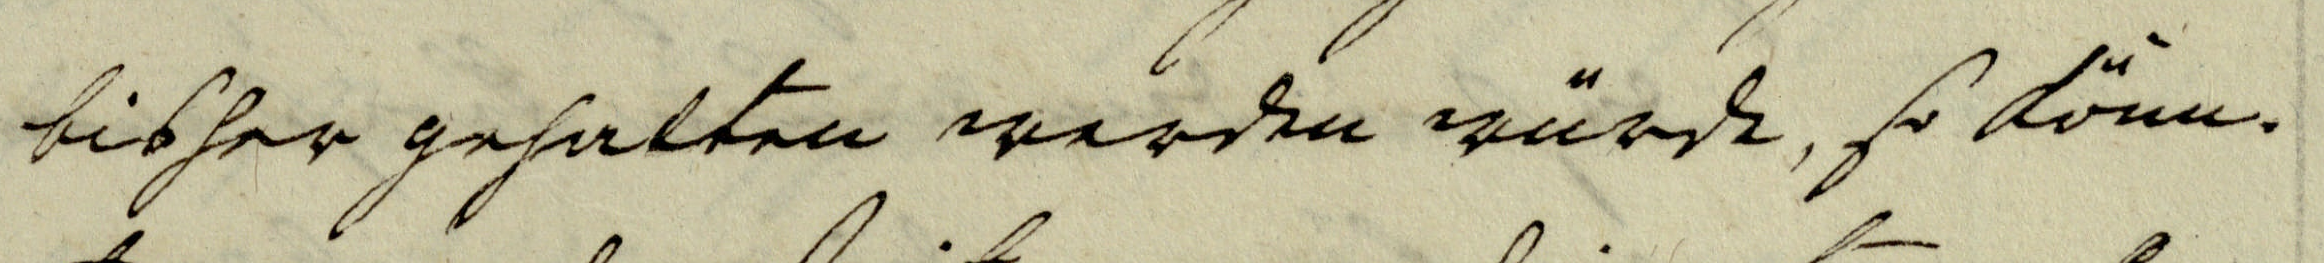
bisher gehalten werden würde, so könn¬
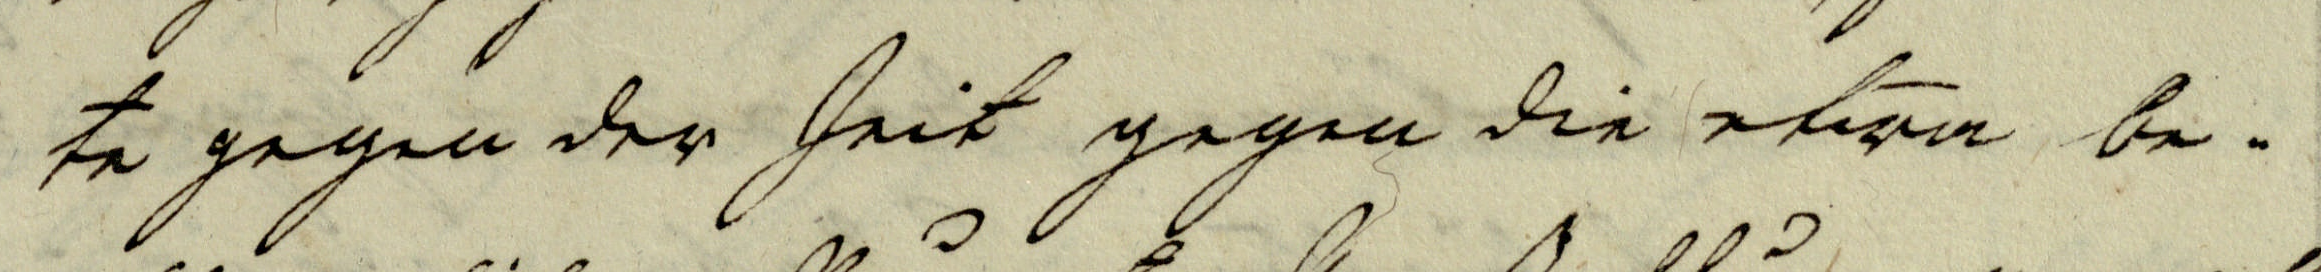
te gegen der Zeit gegen die etwa be¬
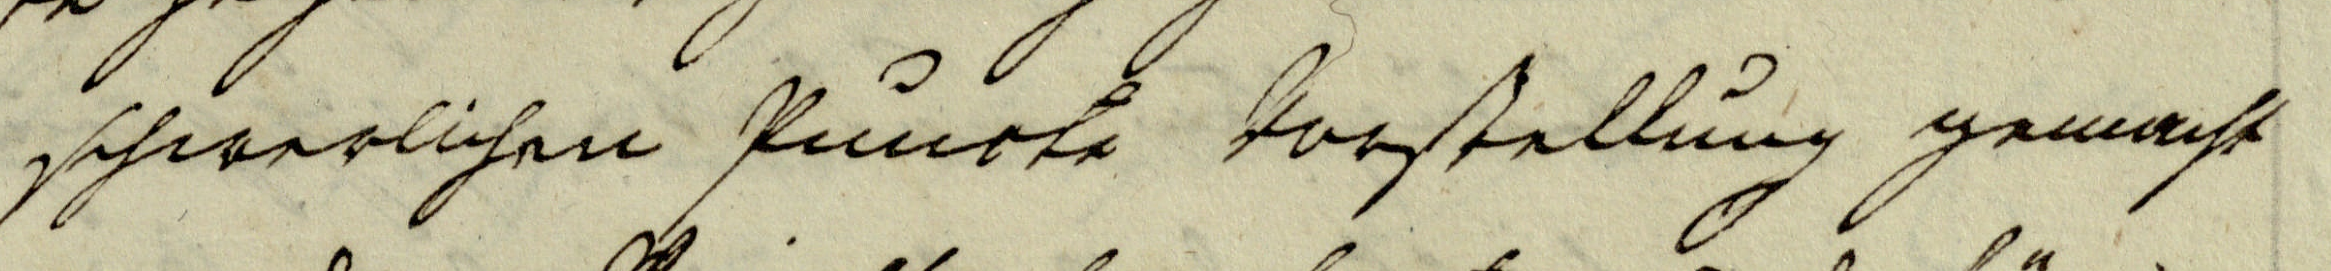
schwerlichen Puncte Vorstellung gemacht
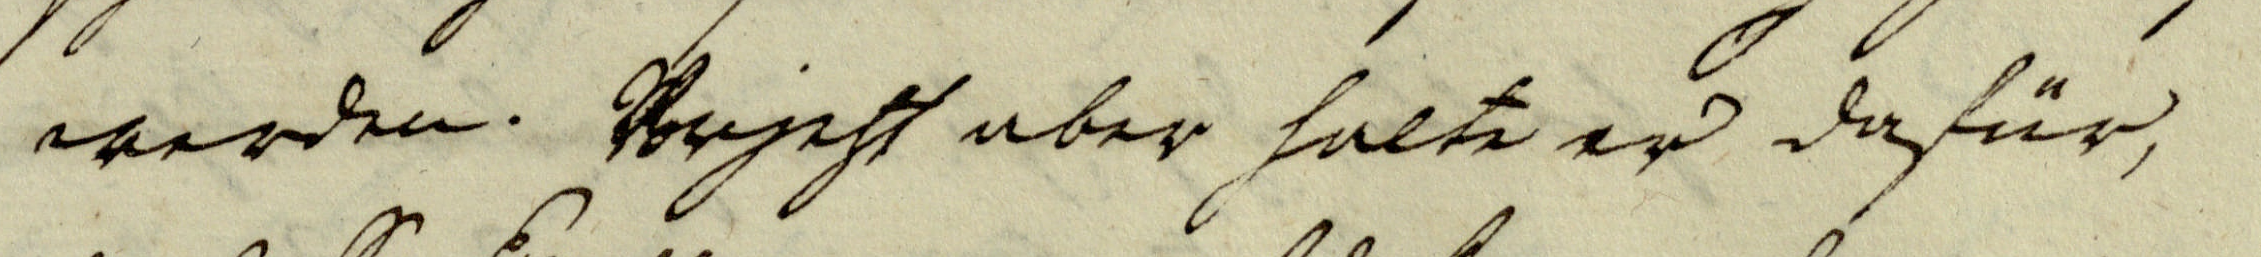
werden. Vorjetzt aber halte er dafür,
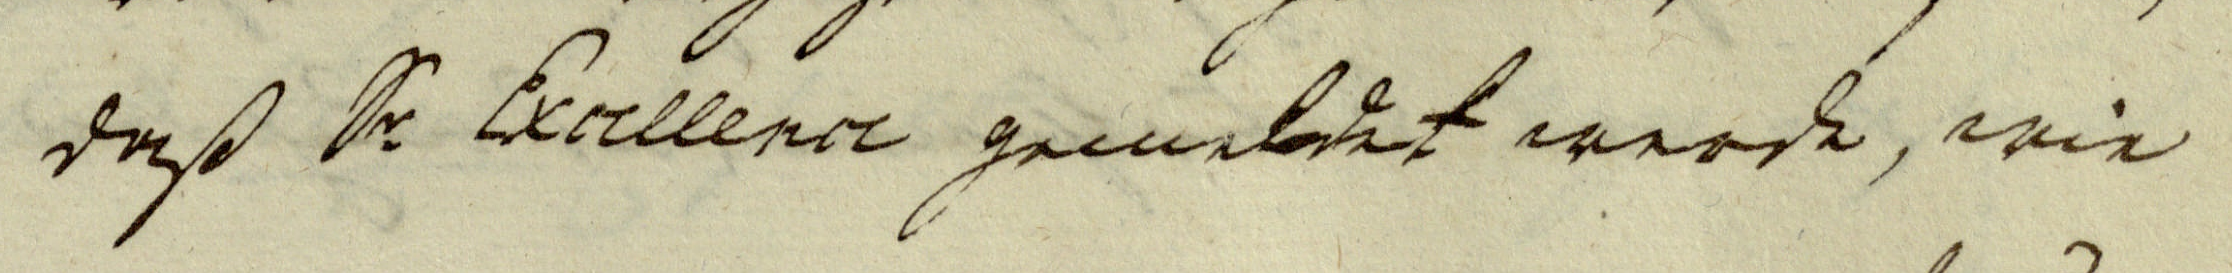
daß Sr Excellence gemeldet werde, wie
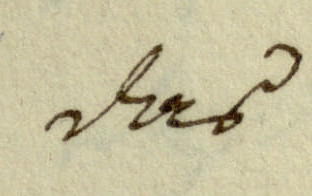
das
